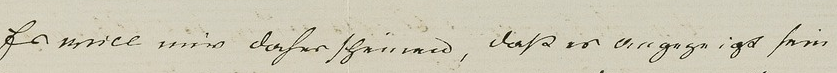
Es will mir daher scheinen, daß es angezeigt sein
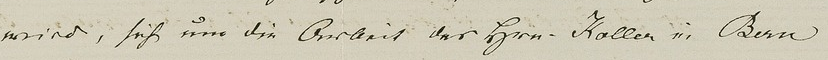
wird, sich um die Arbeit des Hrn. Koller in Bern
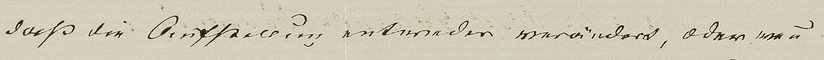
dass die Aufstellung entweder verändert, oder wenn
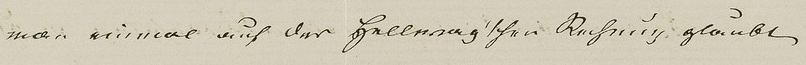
man einmal auf der Hellwag'schen Rechnung glaubt
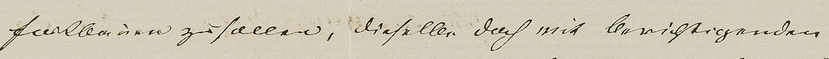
fortbauen zu sollen, dieselben doch mit berichtigenden
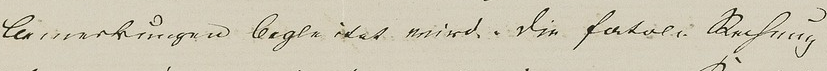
Bemerkungen begleitet wird. Die fatale Rechnung
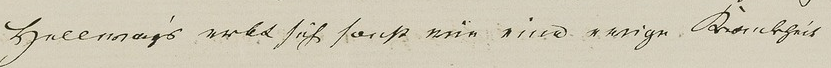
Hellwag's erbt sich sonst wie eine ewige Krankheit
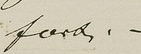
fort. –
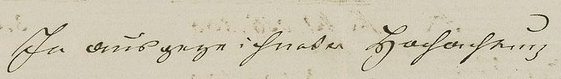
In ausgezeichneter Hochachtung
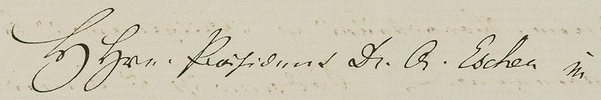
HHrn. Präsident Dr. A. Escher in
